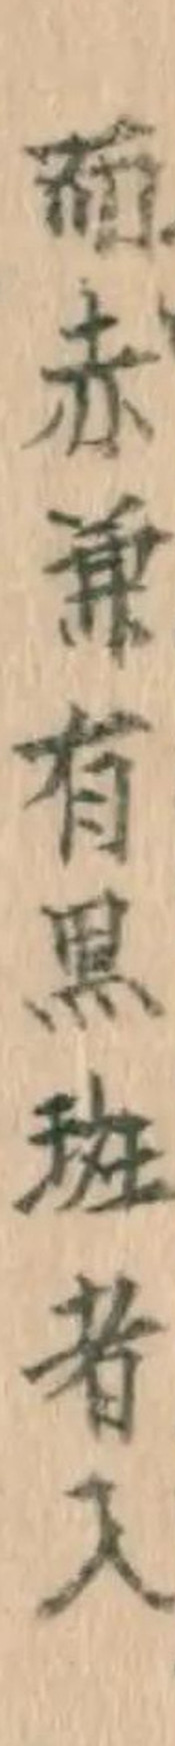而赤兼有黒斑者入
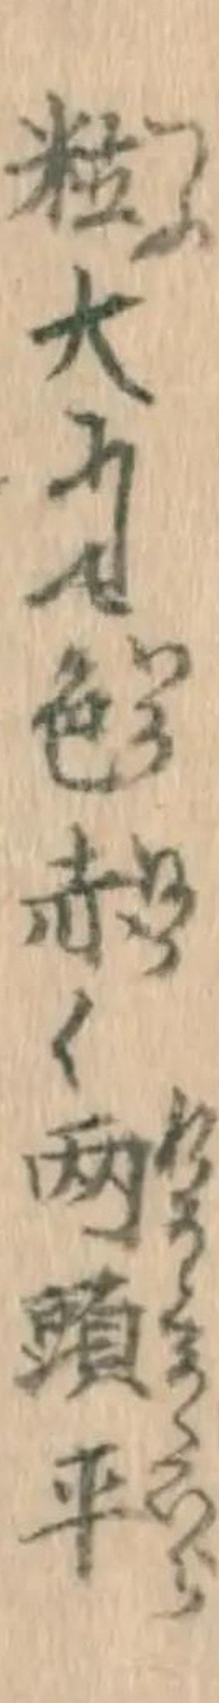粒大にして色赤く両頭平
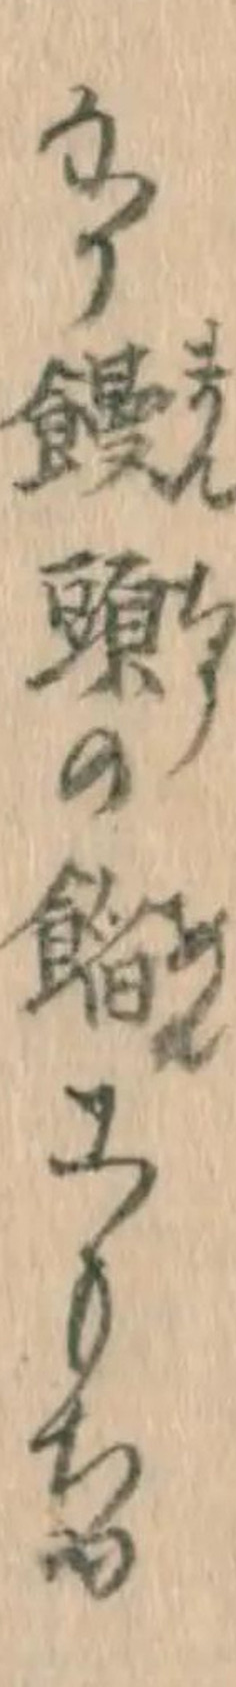なり饅頭の餡にもちゆ
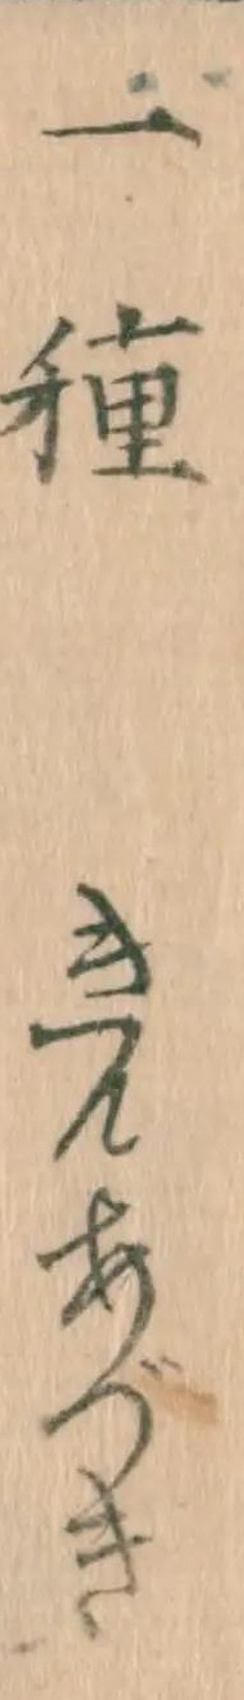一種きんあづき
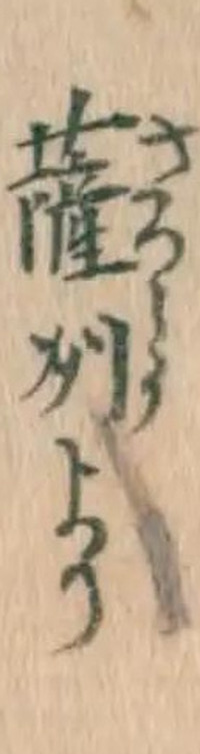薩州より

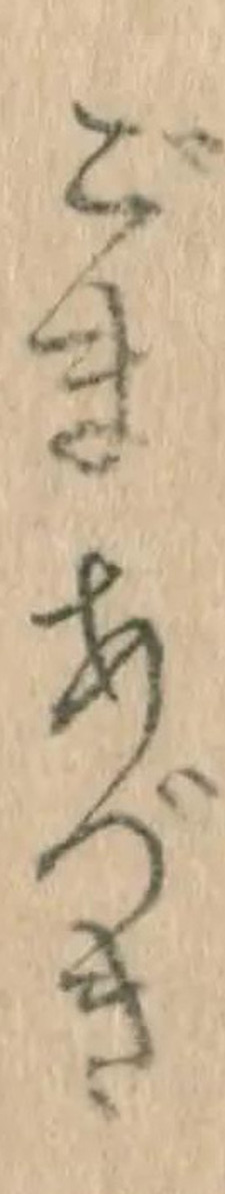ごまあづき
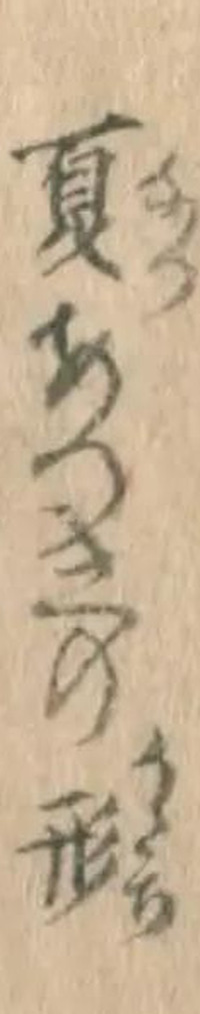夏あつきの形
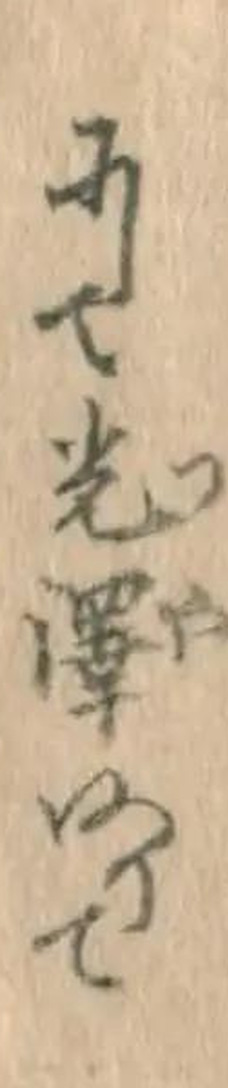にして光沢ありて
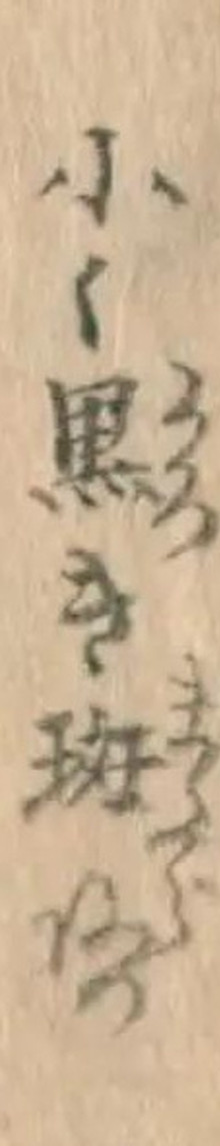小く黒き斑あり
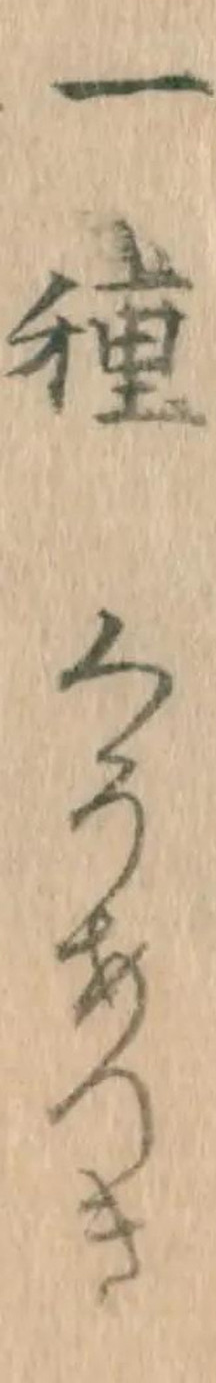一種くろあつき
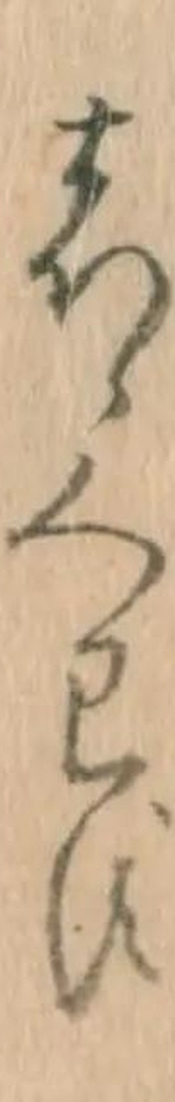しゝくわず
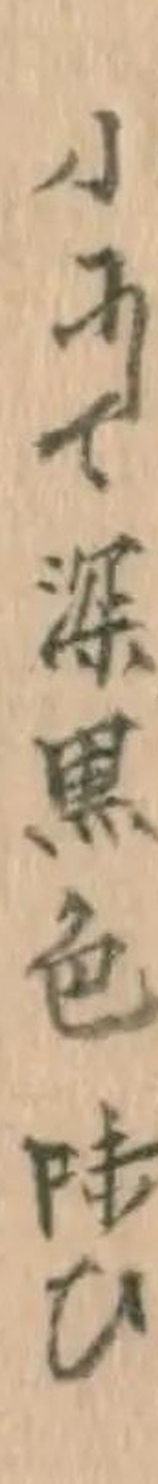小にして深黒色味ひ
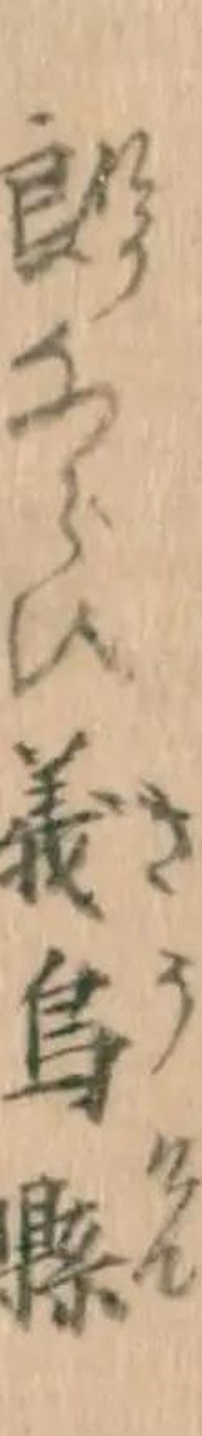良ならす義烏県
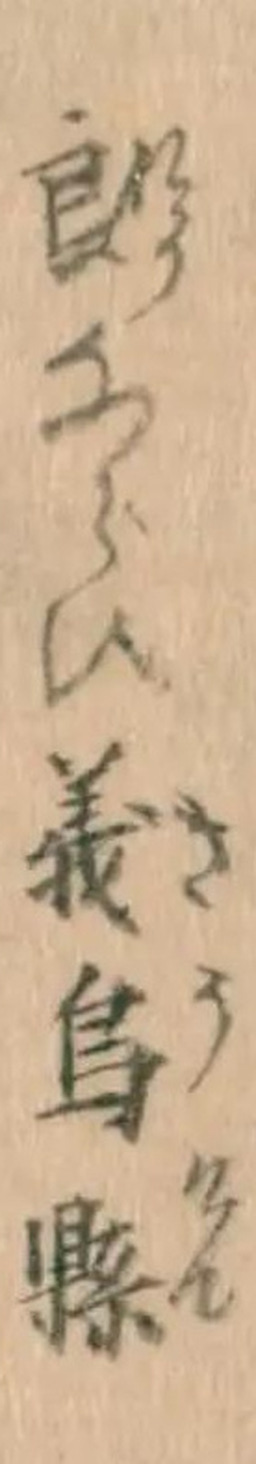良ならす義烏県
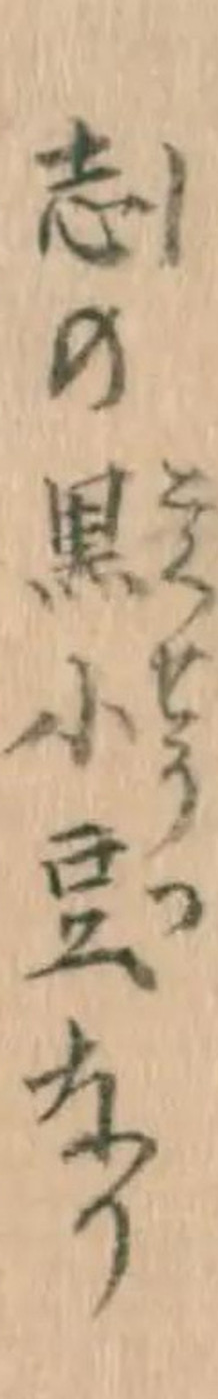志の黒小豆なり
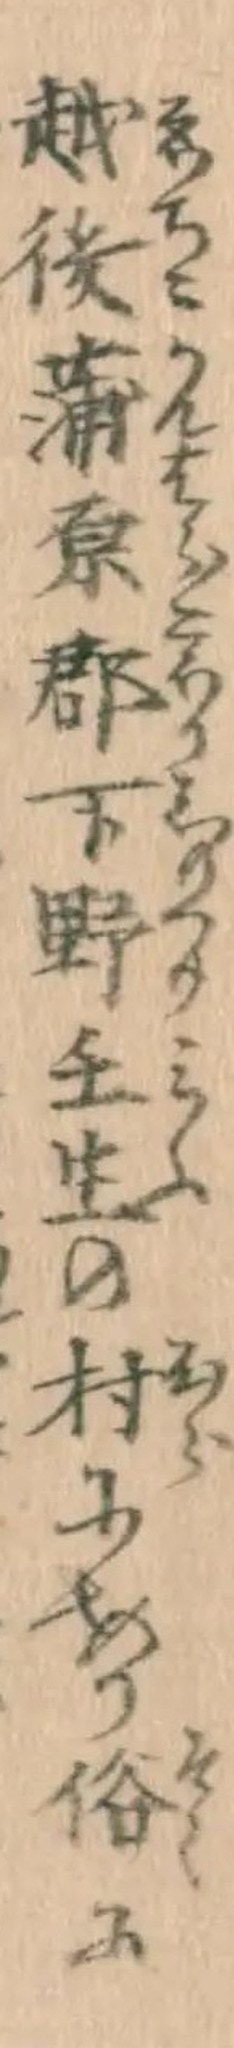越後蒲原郡下野壬生の村にあり俗に
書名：本草図譜. 巻43-45
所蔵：国立国会図書館 National Diet Library, JAPAN
